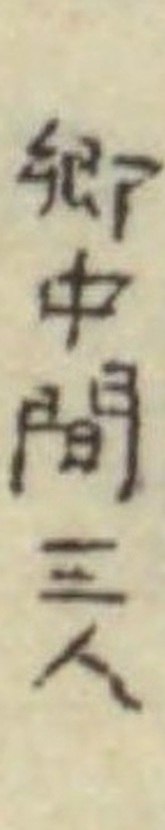厩中間一人
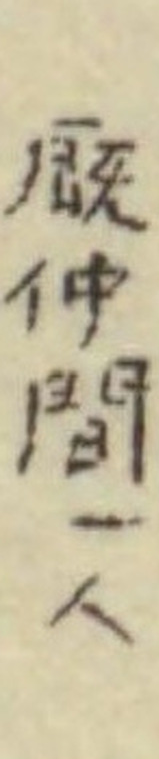厩仲間一人
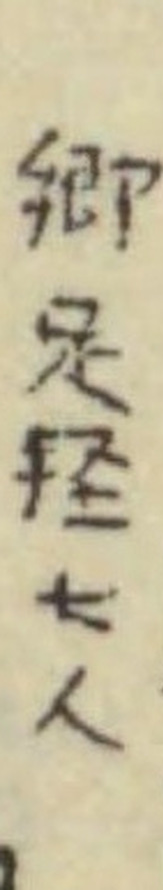御足軽七人
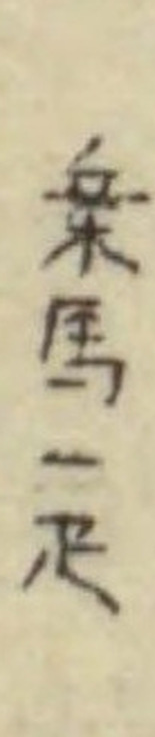乗馬一疋
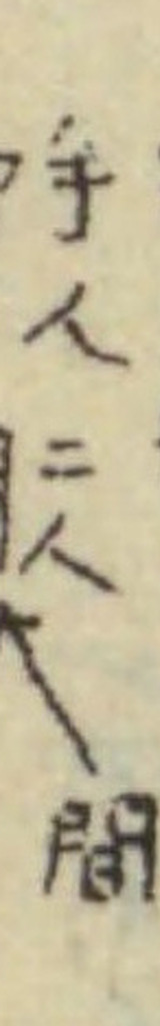手人二人
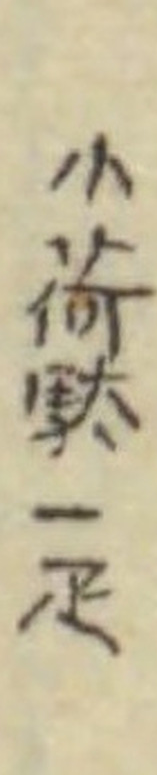小荷駄一疋
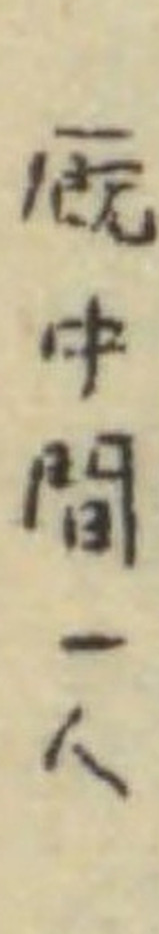厩中間一人
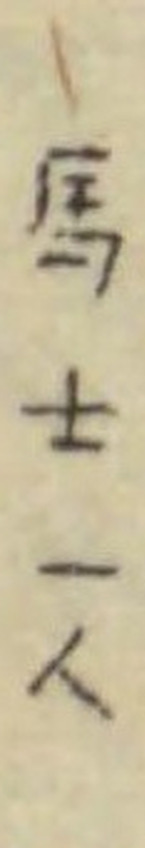馬士一人

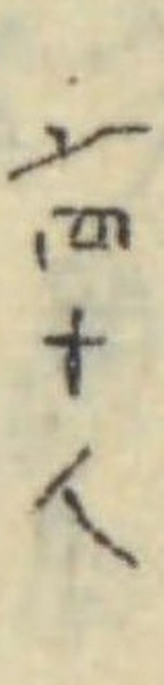〆四十人
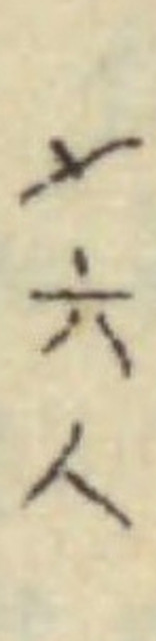〆六人
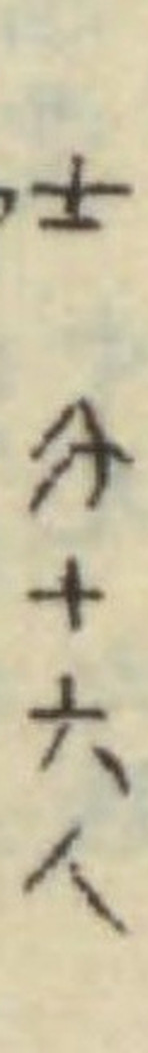士分十六人
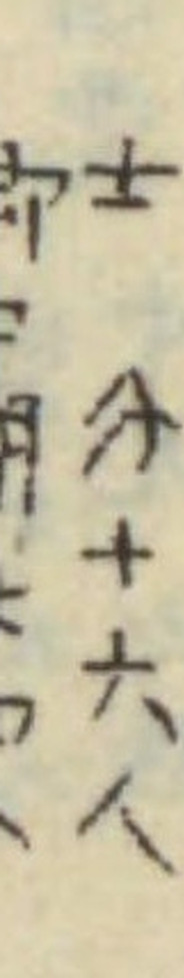士分十六人
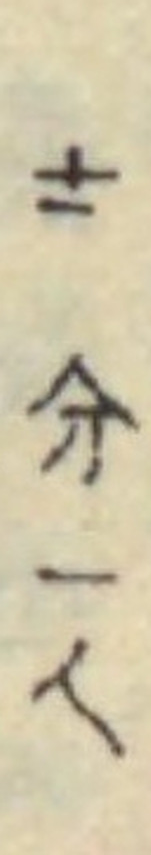士分一人
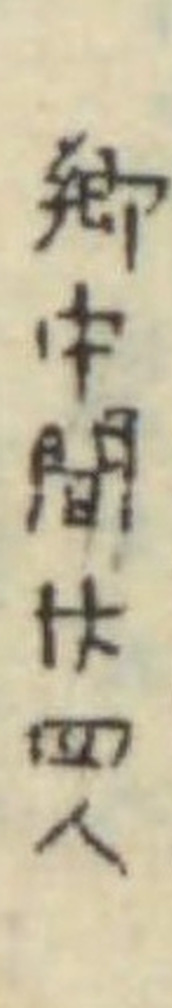御中間廿四人
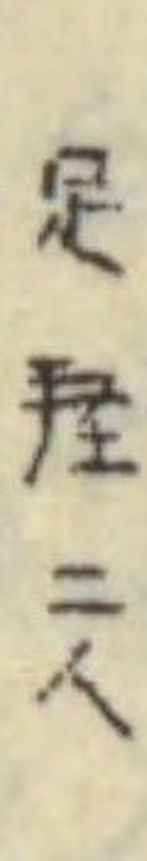足軽二人
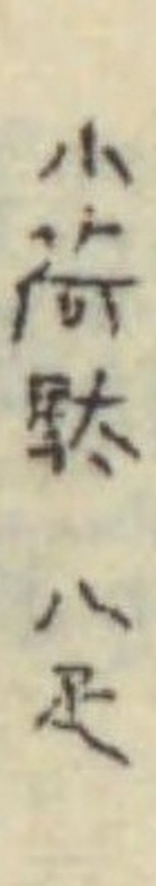小荷駄一疋
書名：三河吉田藩動員史料
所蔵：国立国会図書館 National Diet Library, JAPAN
